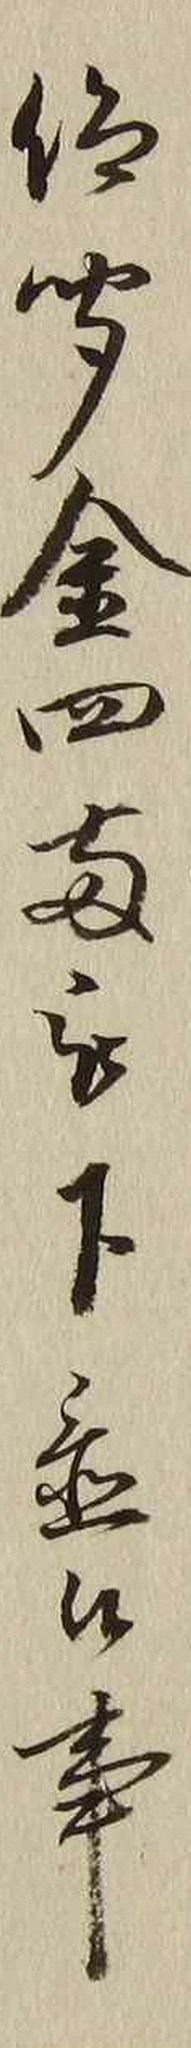仰聞金四両被下置候事
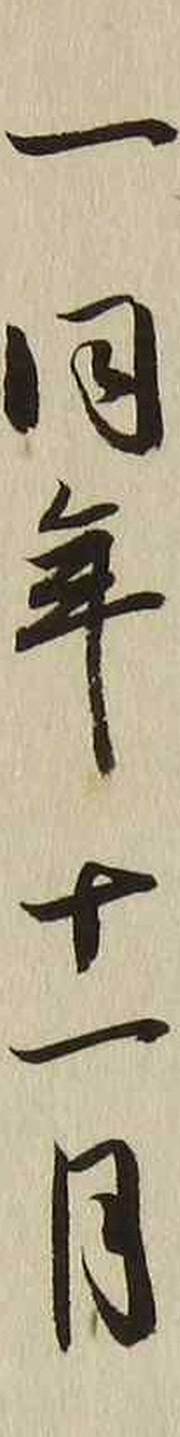一同年十一月
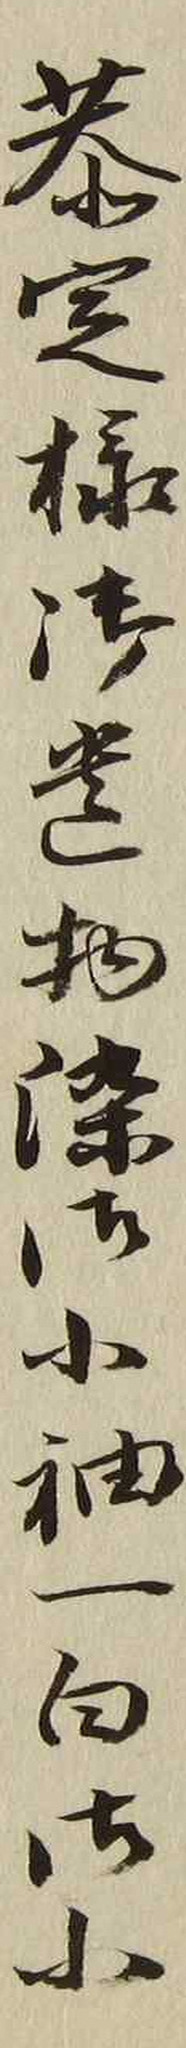恭定様御遺物染御小袖一白御小
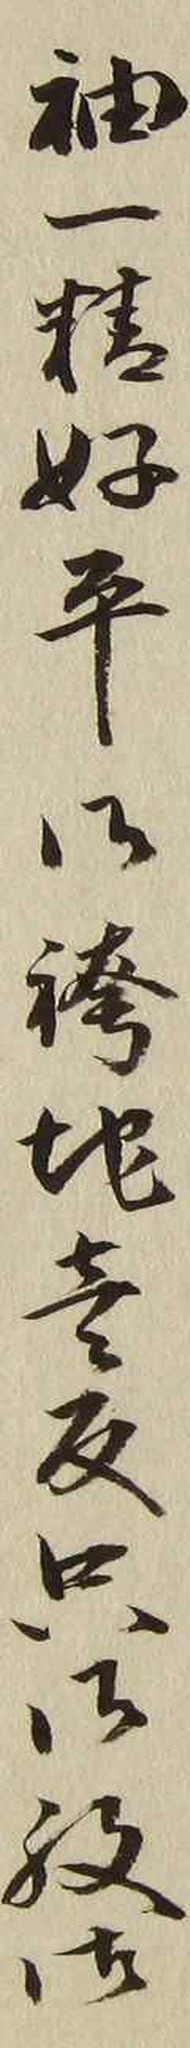袖一精好平御袴地壱反只御紋御
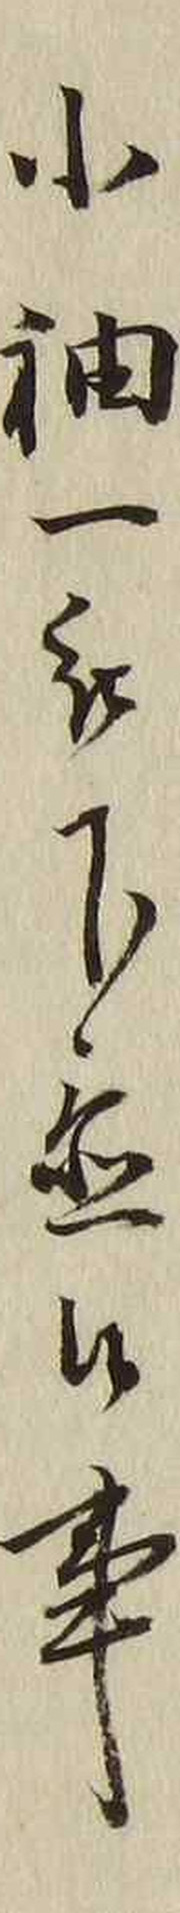小袖一被下置候事
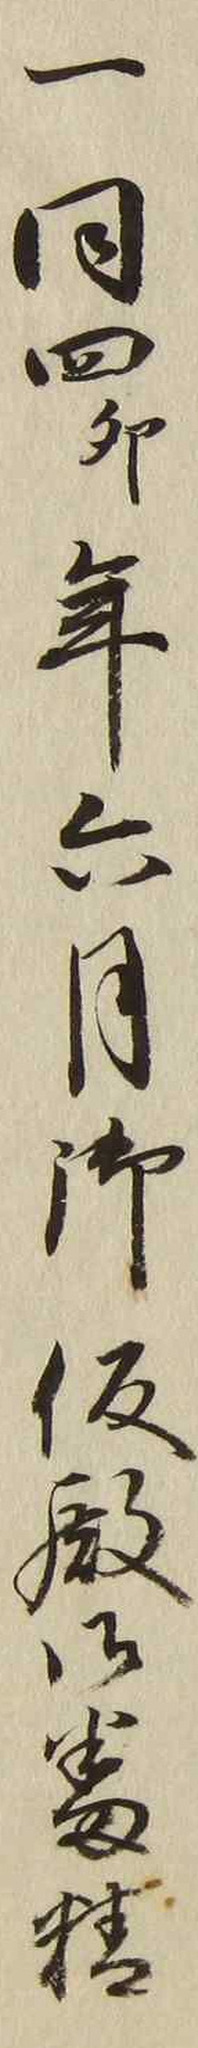一同四卯年六月御仮殿御番精

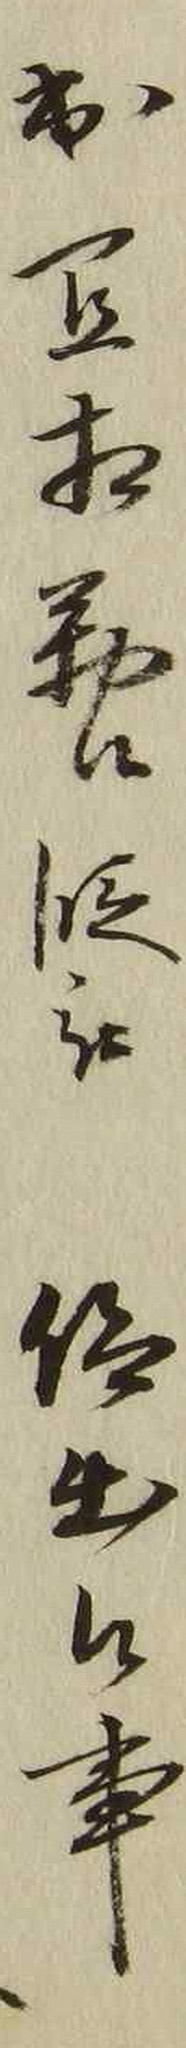出宜相勤候段被仰出候事
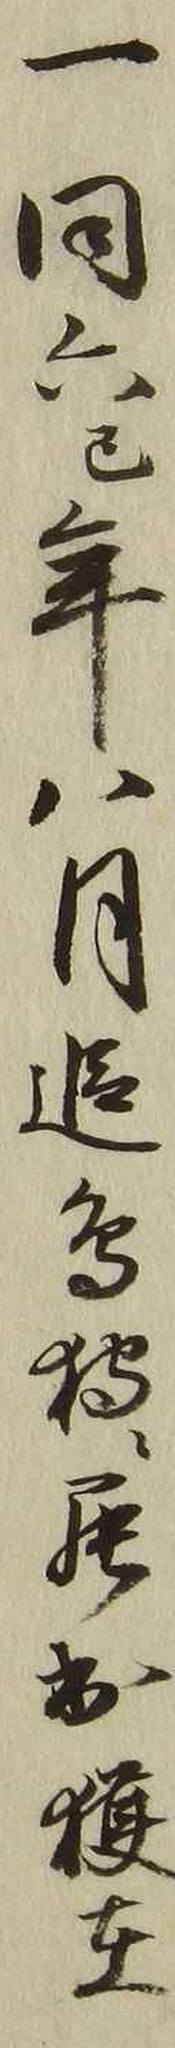一同六巳年八月追鳥狩ニ罷出獲在
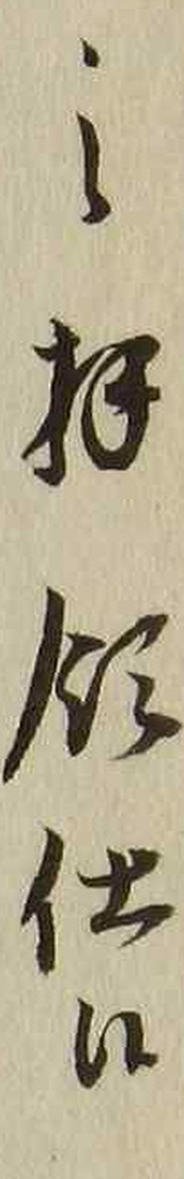之拝領仕候
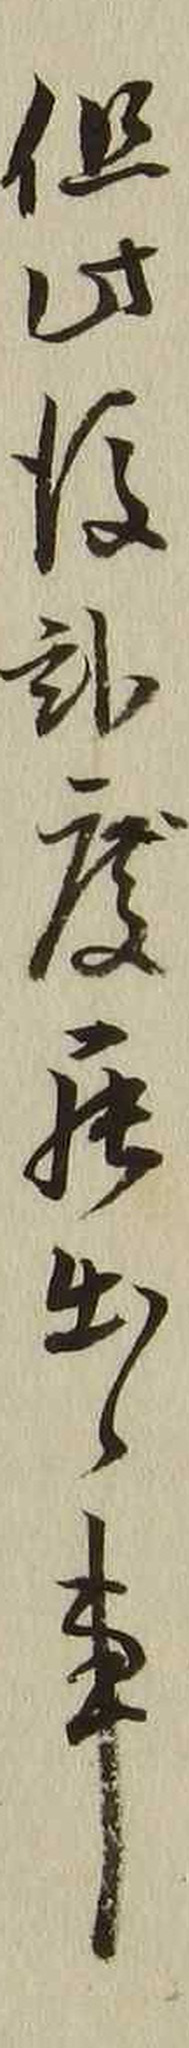但此度弐度罷出候事
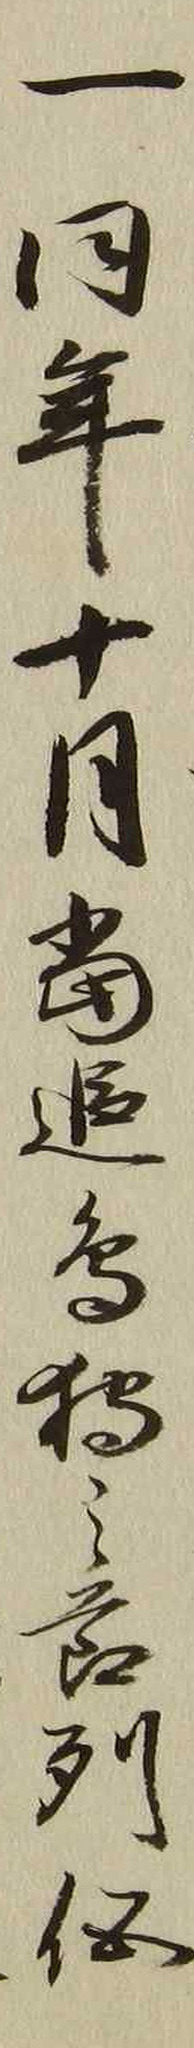一同年十月当追鳥狩之節列伍
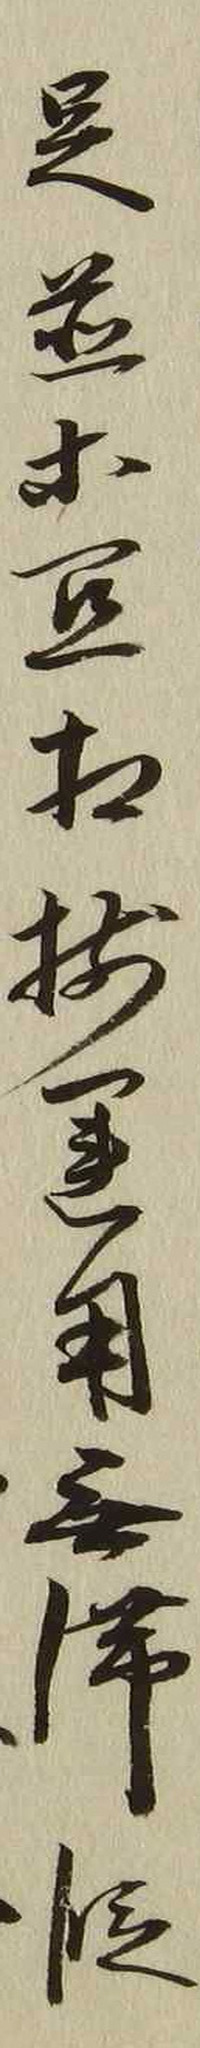足並等宜相揃運用無滞段
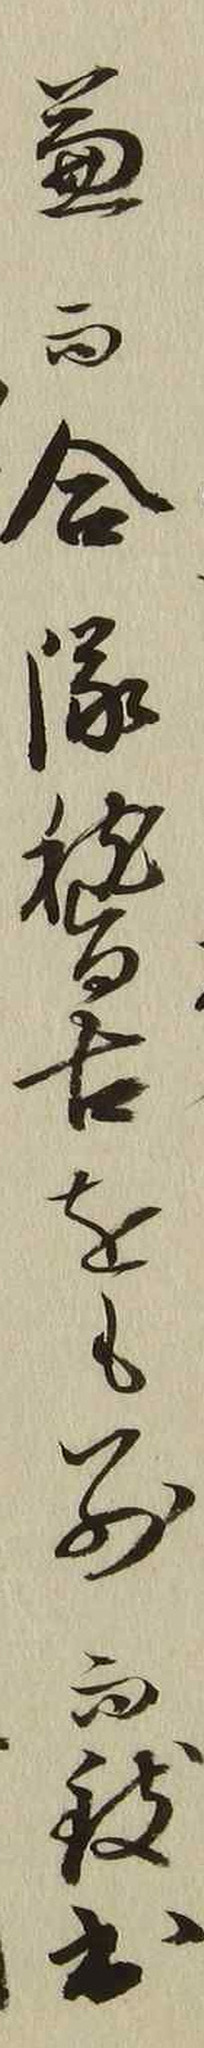兼而合隊稽古をも別而致出
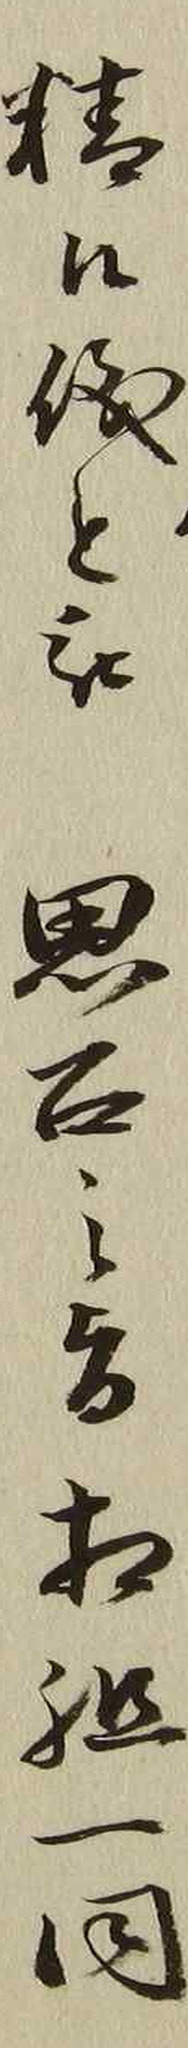精候儀と被思召之旨相組一同
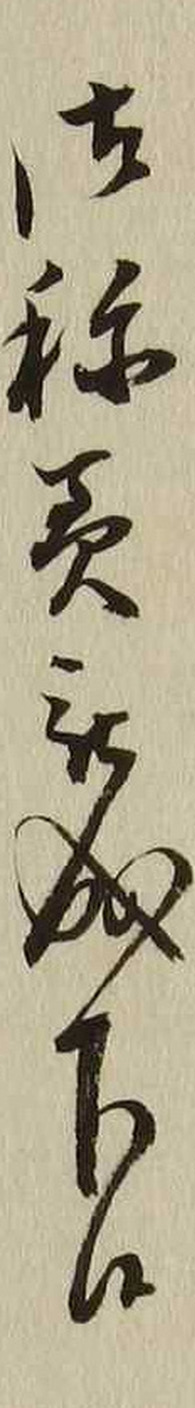御称美被成下候
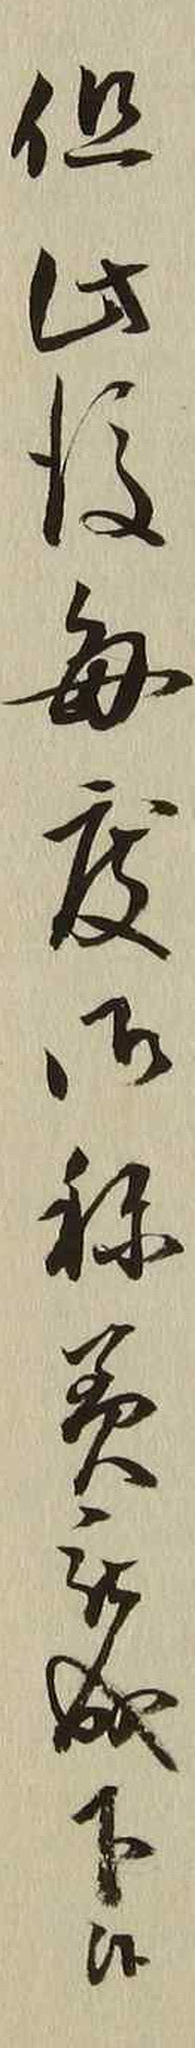但此後毎度御称美被成下候
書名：諸士系譜　巻之61　と之部4
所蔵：会津若松市立会津図書館
